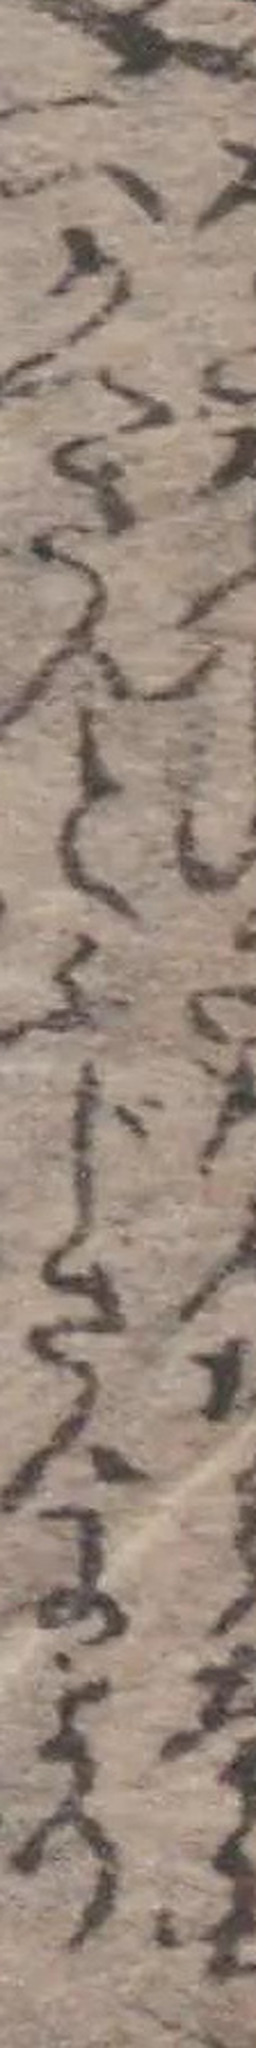へかへさんとふじさんにより
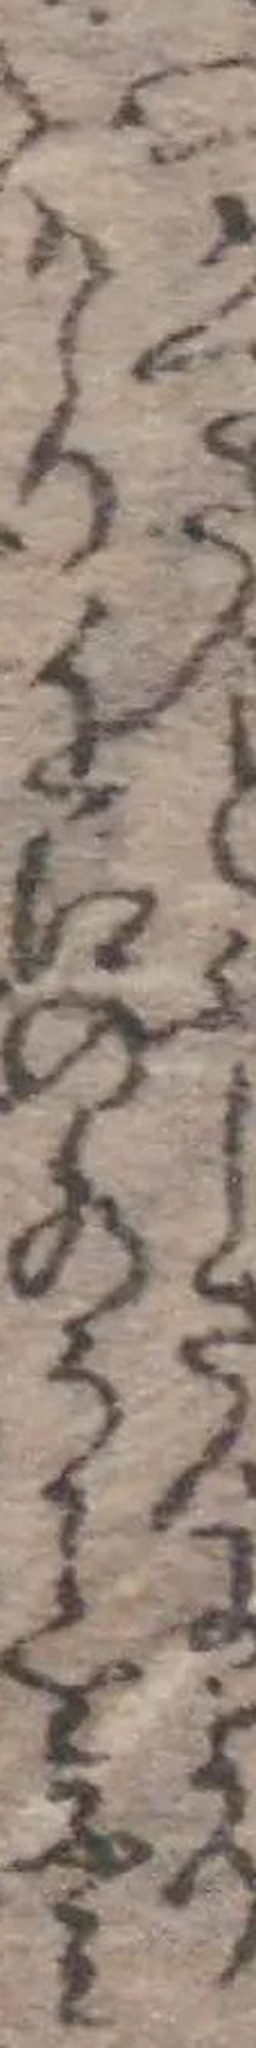かゝり近江の水うみをふみ
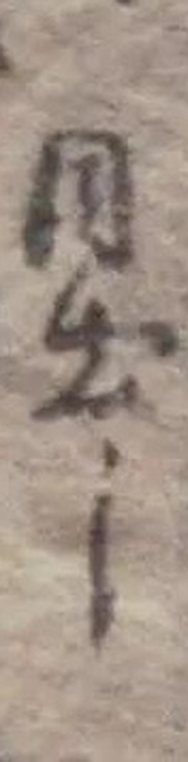目出し
